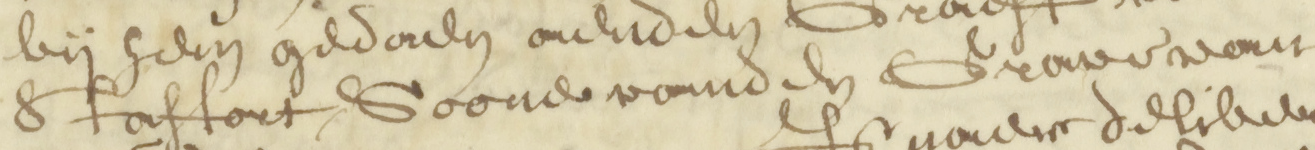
Staffort, Soone vanden Grave van
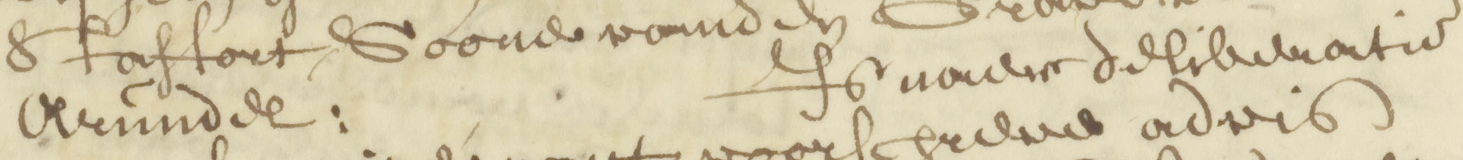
Arundel: Is naer deliberatie
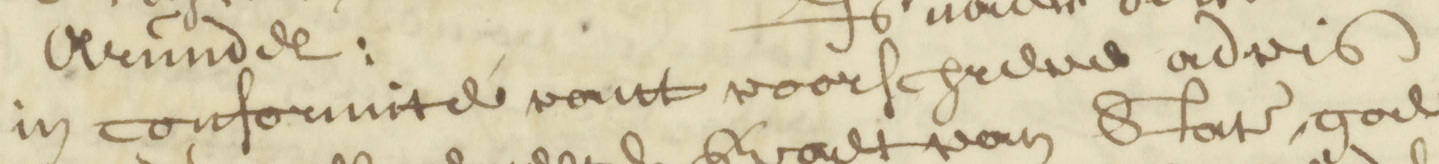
in conformité vant voorschreve advis
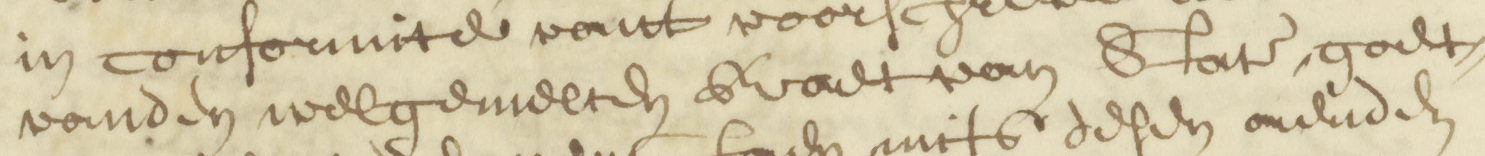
vanden welgemelten Raet van State, goet„
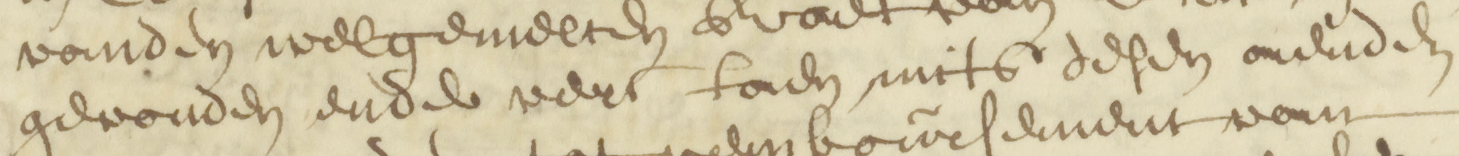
gevonden ende verstaen, mits desen aenden
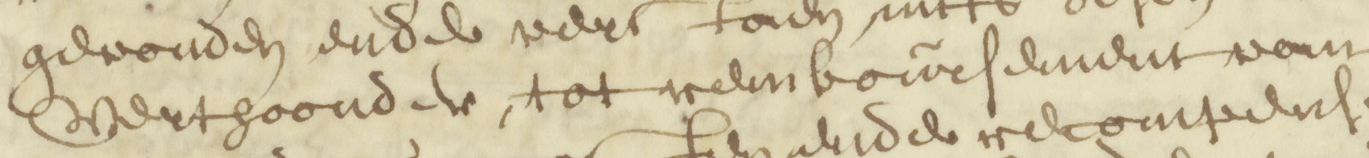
Verthoonder, tot remboursement van
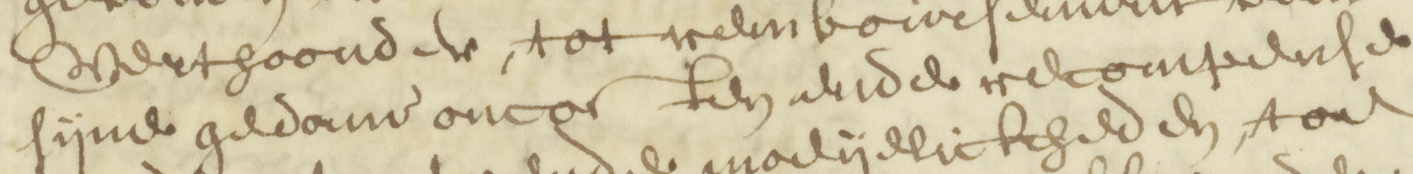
sijne gedane oncosten ende recompense
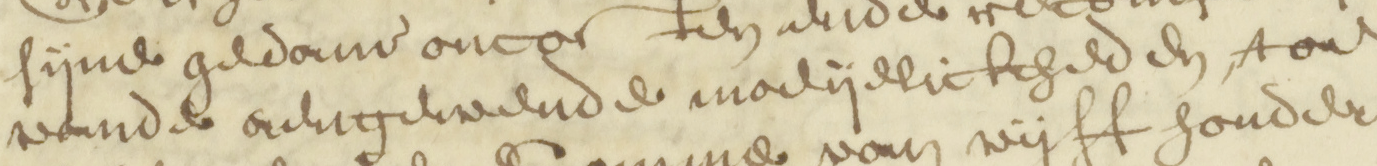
vande aengewende moeijelickheden, toe
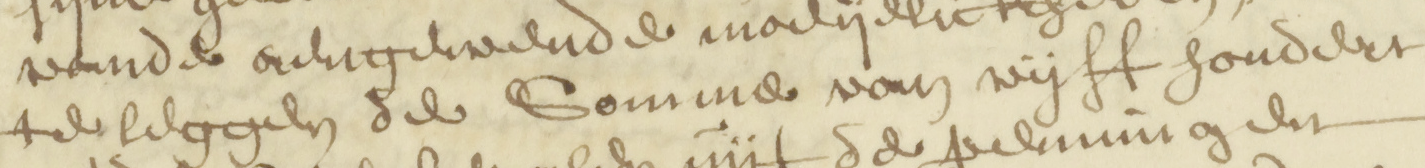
te leggen de Somme van vijff hondert
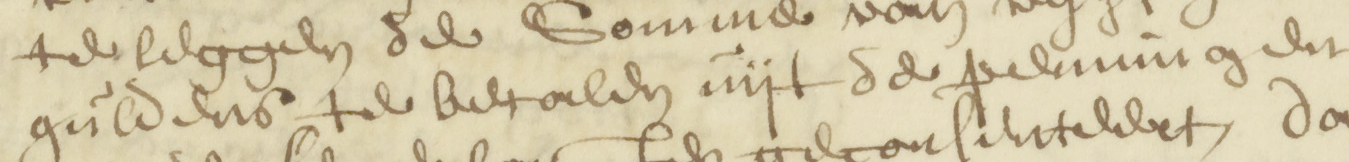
guldens te betalen uijt de penningen
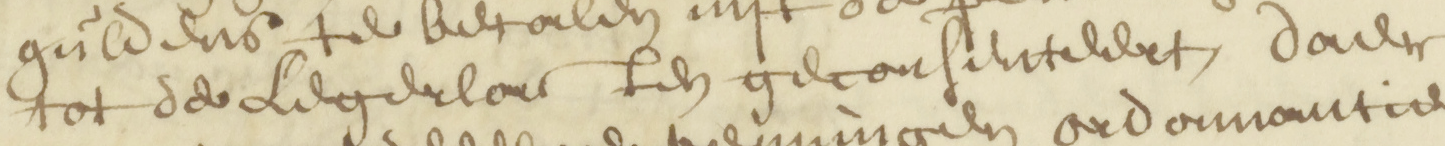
tot de Legerlasten geconsenteert, daer
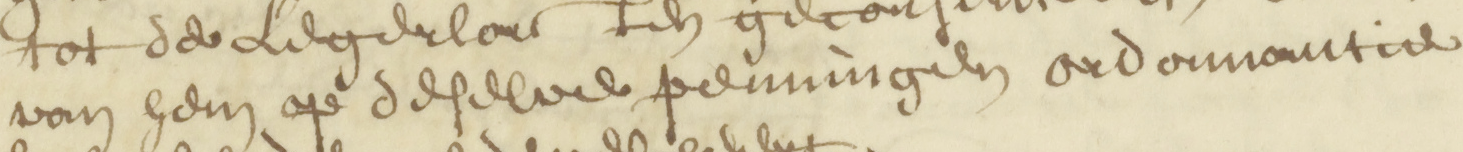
van hem op deselve penningen ordonnantie
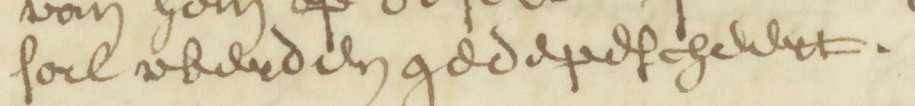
sal werden gedepescheert.
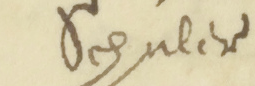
Schuler
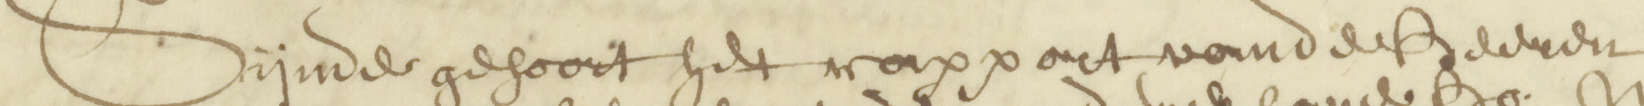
Sijnde gehoort het rapport vande Heeren
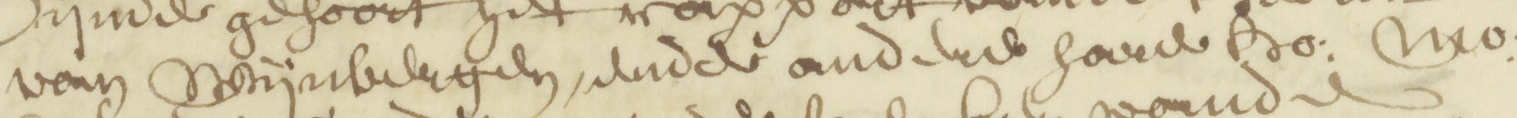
van Wijnbergen, ende andere hare Ho:Mo:
